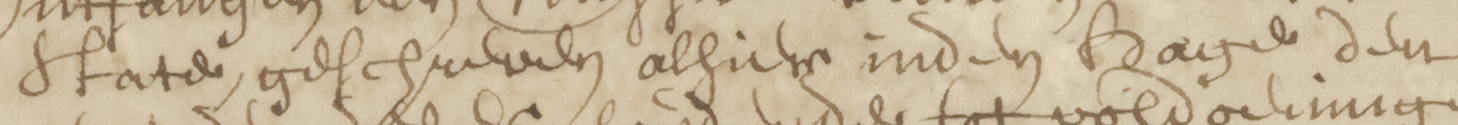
State, geschreven alhier inden Hage den
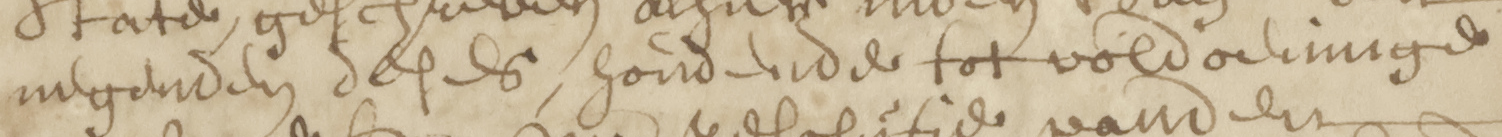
negenden deses, houdende tot voldoeninge
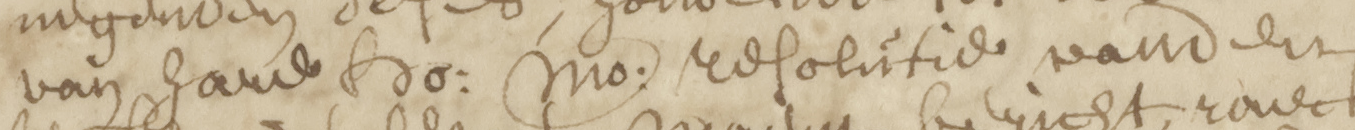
van hare Ho:Mo: resolutie vanden
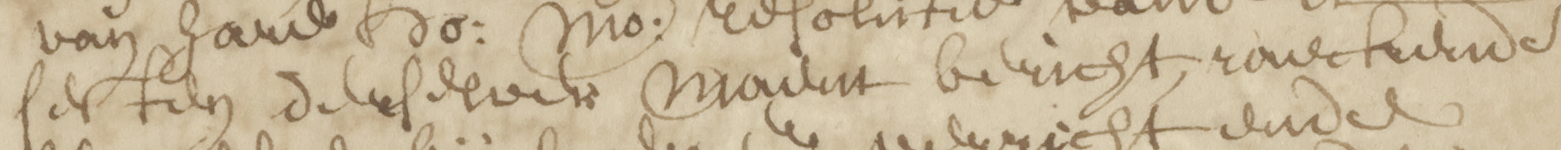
sesten derselver maent bericht raeckende
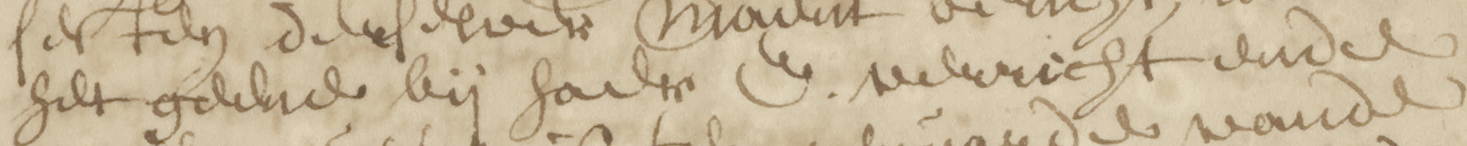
het geene bij haer E. verricht ende
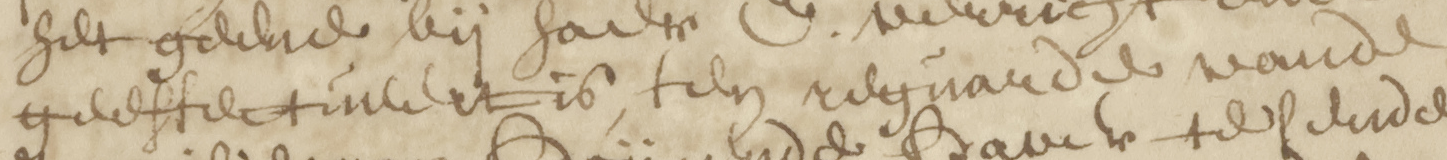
geeffectueert is ten reguarde vande
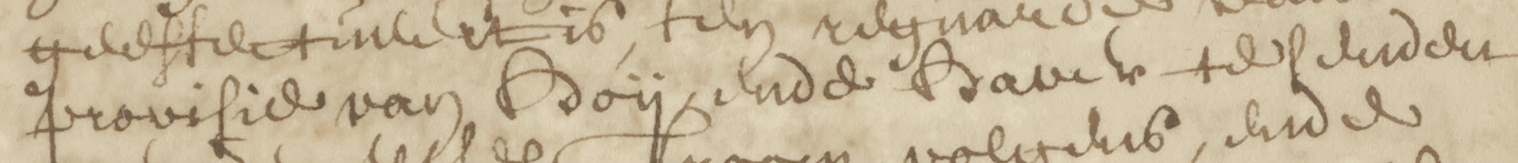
provisie van Hoij, ende Haver te senden
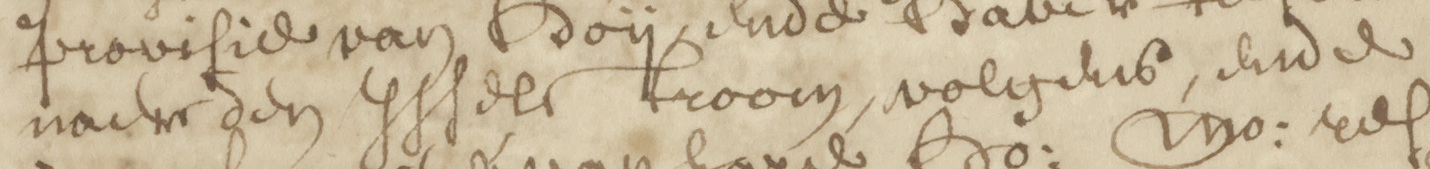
naer den Isselstroom, volgens, ende
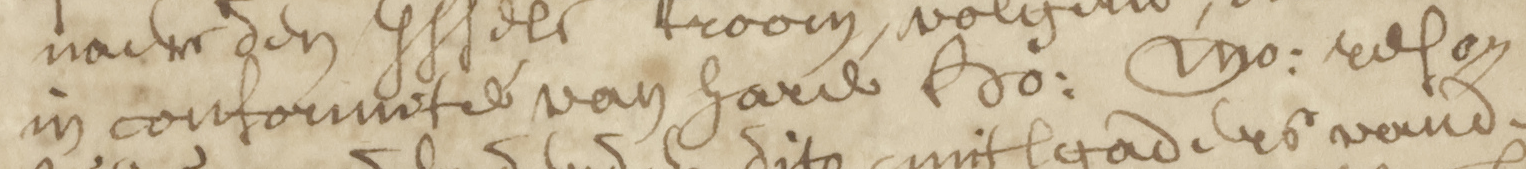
in conformité van hare Ho:Mo: reso,,
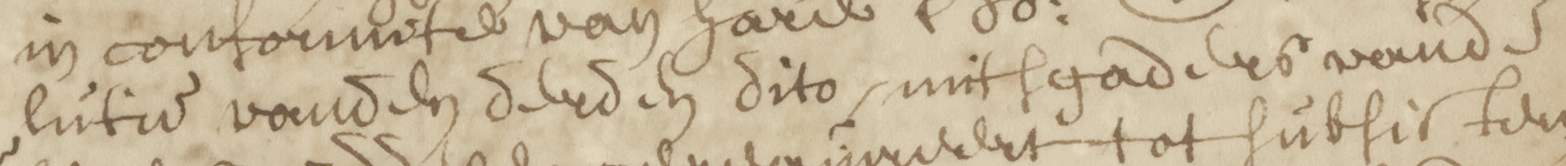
lutie vanden derden dito, mitsgaders vande
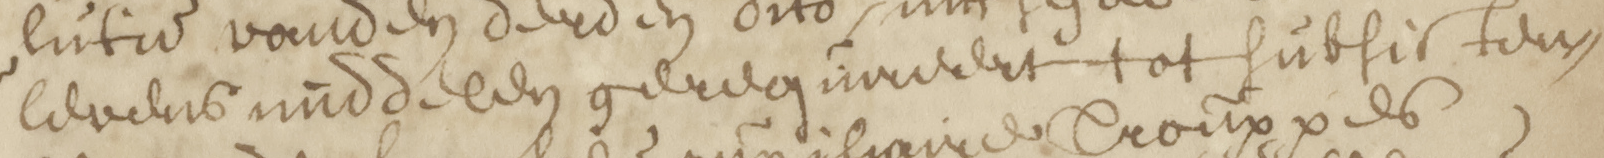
levensmiddelen gerequireert tot subsisten„
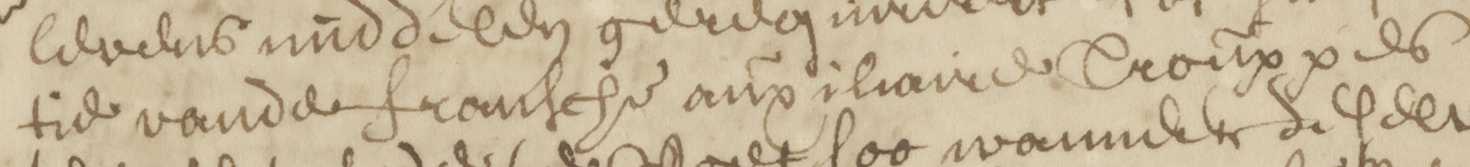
tie vande fransche auxliaire Trouppes
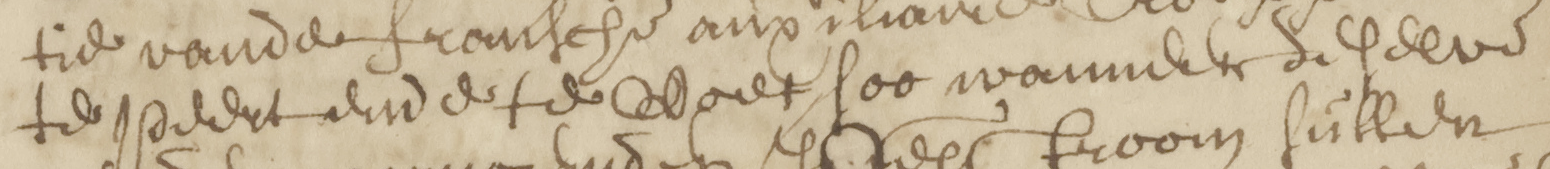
te peert ende te Voet, soo wanneer deselve
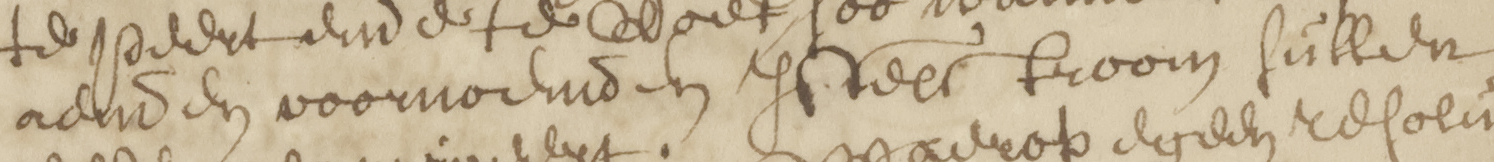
aenden voornoemden Isselstroom sullen
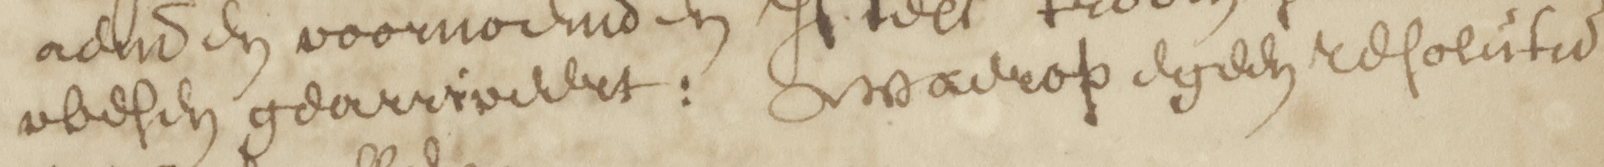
wesen gearriveert: Waerop egeen resolutie
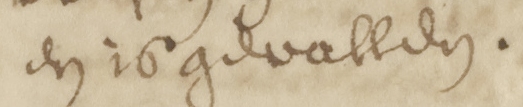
en is gevallen.
